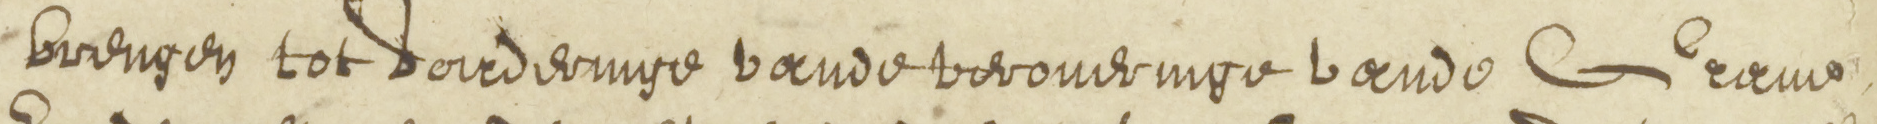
brengen tot Voirderinge vande veroueringe vande Graue
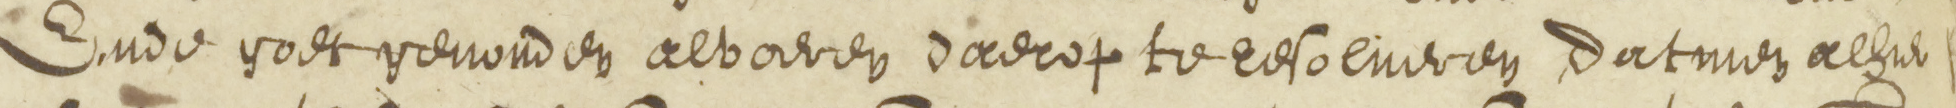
Ende goetgeuonden alvoeren daerop te resolueren, datmen alhier
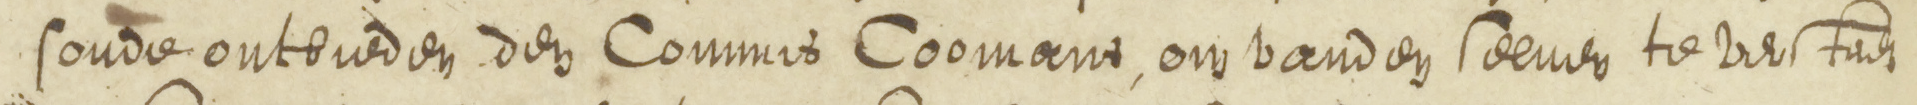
soude ontbieden den Commis Coomans, om vanden seluen te verstaen
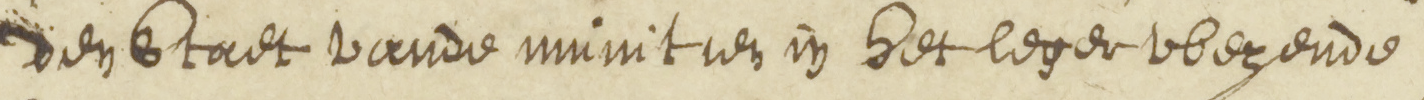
den Staet vande munitien in het leger wezende.
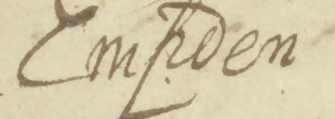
Empden
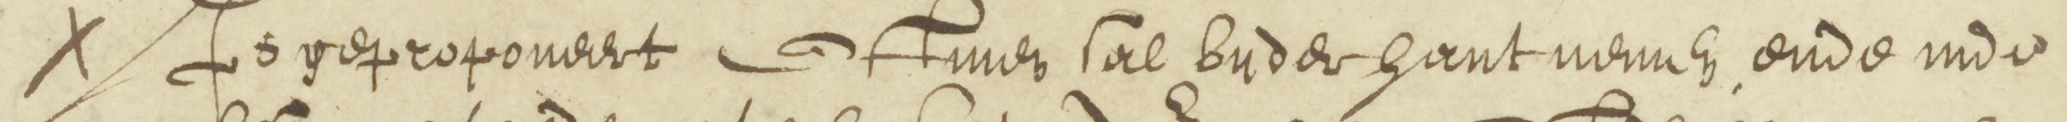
Is geproponeert Off men sal byder hant nemen, ende inde
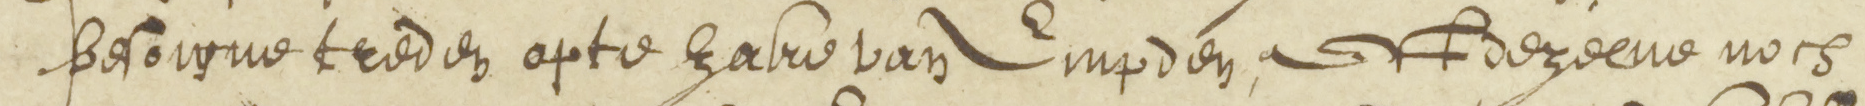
besoigne treden opte zake van Empden, Off dezelue noch
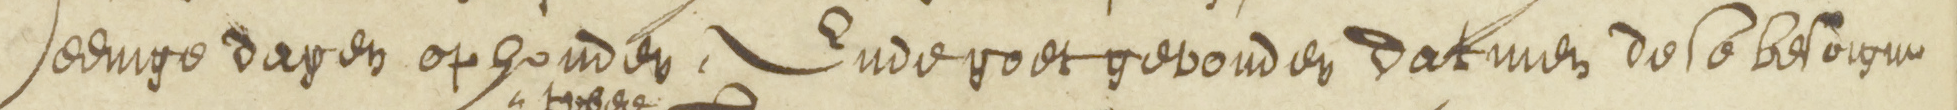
eenige dagen ophouden. Ende goetgevonden dat men dese besoigne
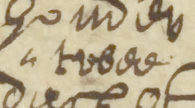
''twee
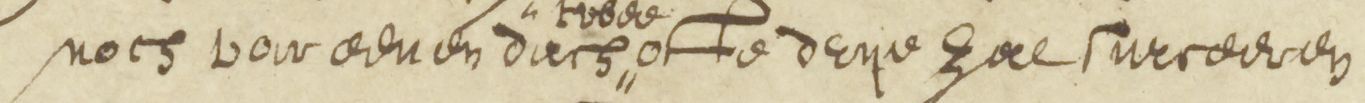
noch voir eenen dach,,ofte drye zal surceeren.
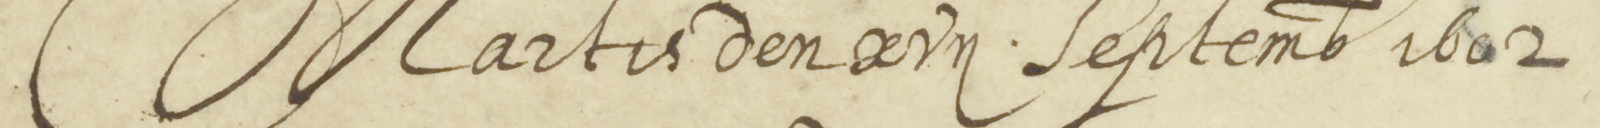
Martis den xvijen. Septemb 1602
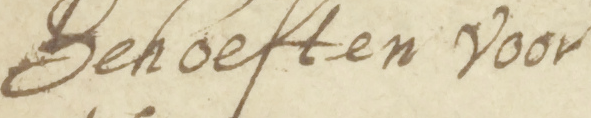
Behoeften voor
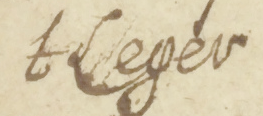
t Leger
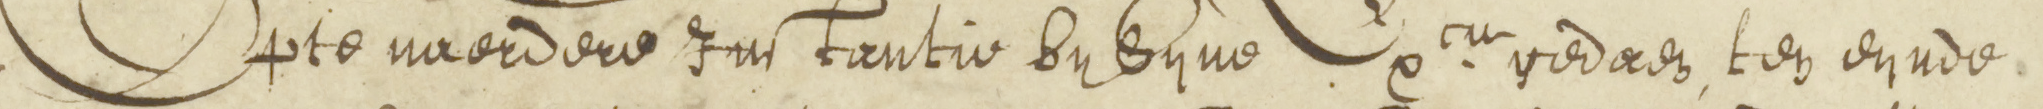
Opte naerdere instantie by Syne Excie. gedaen, ten eynde
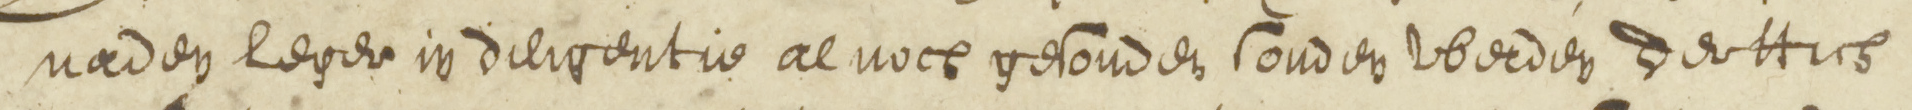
naden leger in diligentie al noch gesonden souden werden derttich
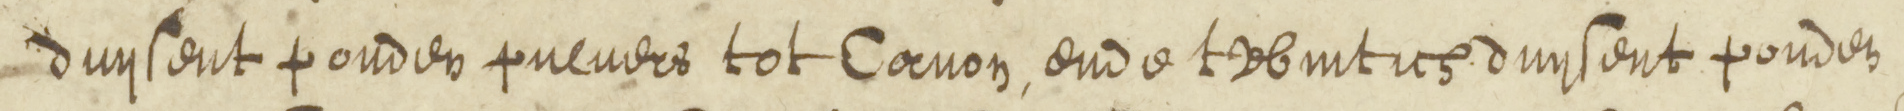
duysent ponden puluers tot Canon, ende twintich duysent ponden
